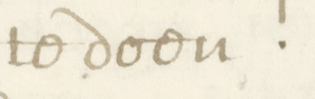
te doen.
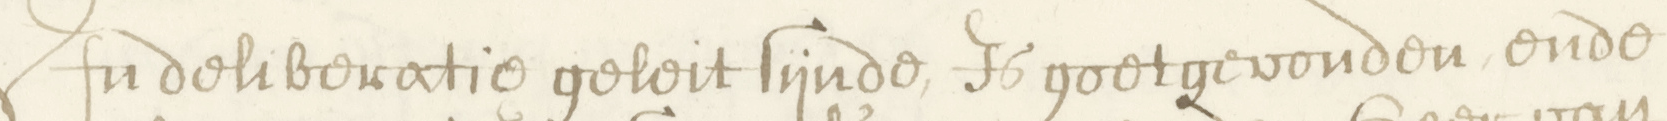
In deliberatie geleit sijnde, Is goetgevonden, ende
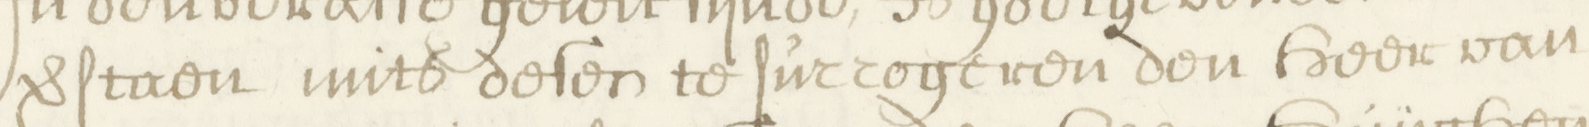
vstaen mits desen te surrogeren den heer van
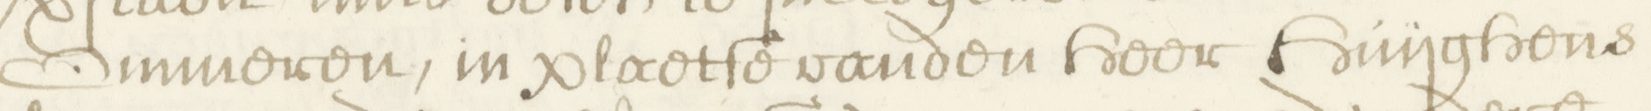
Ommeren, in plaetse vanden heer Huijghens
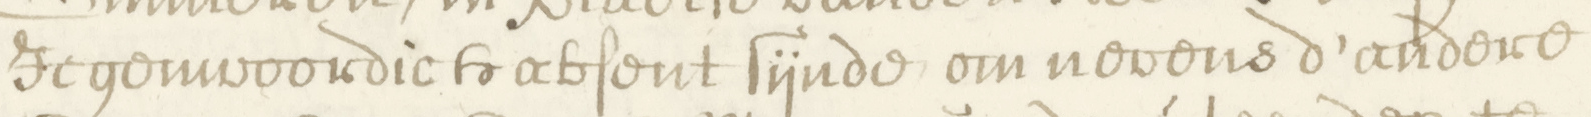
Jegenwoordich absent sijnde, om nevens d'andere
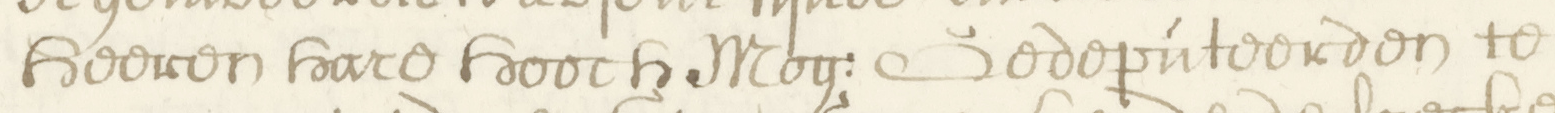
heeren hare hooch Mog: Gedeputeerden te
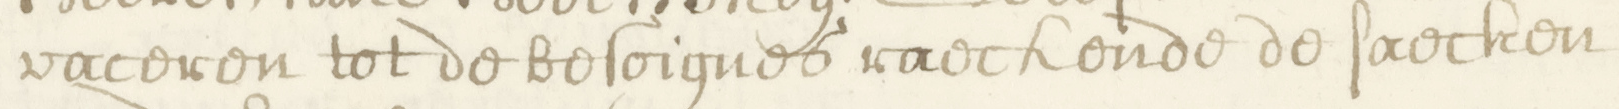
vaceren tot de besoignes raeckende de saecken
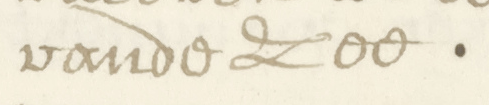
vande Zee.
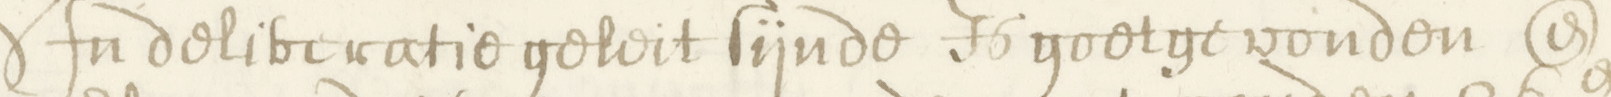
In deliberatie geleit sijnde Is goetgevonden &
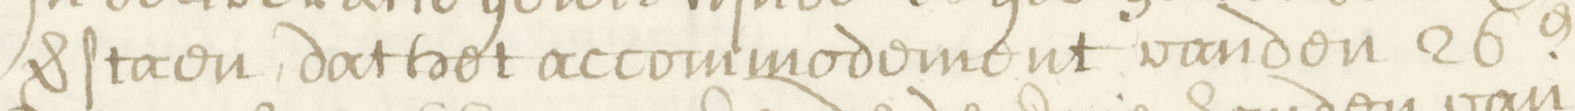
vstaen, dat het accommodement vanden 26e.
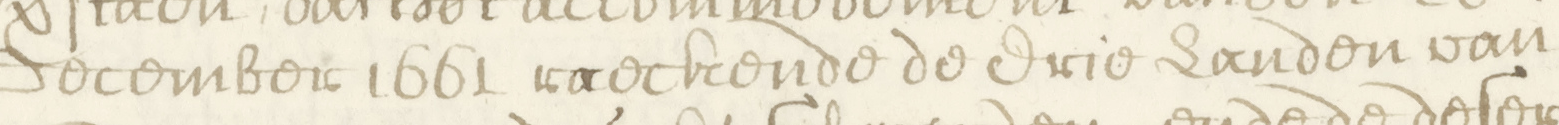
December 1661 raeckende de Drie Landen van
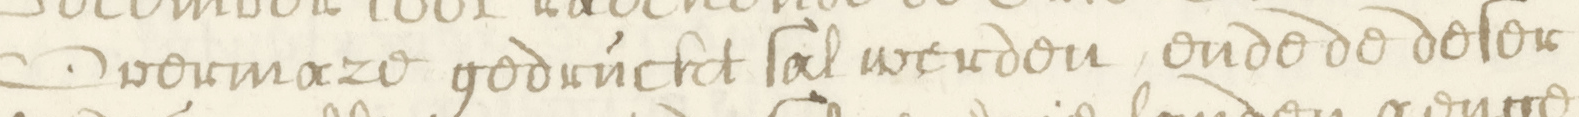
Overmaze gedruckt sal werden, ende de deser
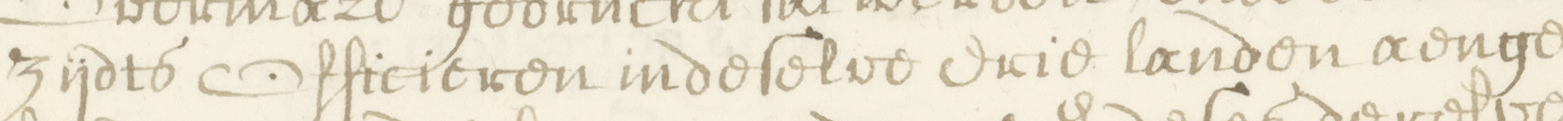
zijdts Officieren in deselve Drie landen aenge
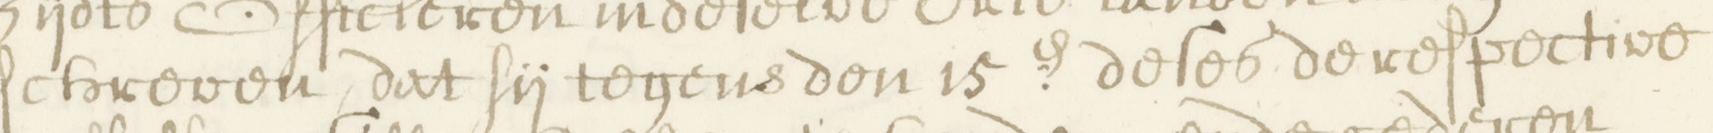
schreven, dat sij tegens den 15e. deses de respective
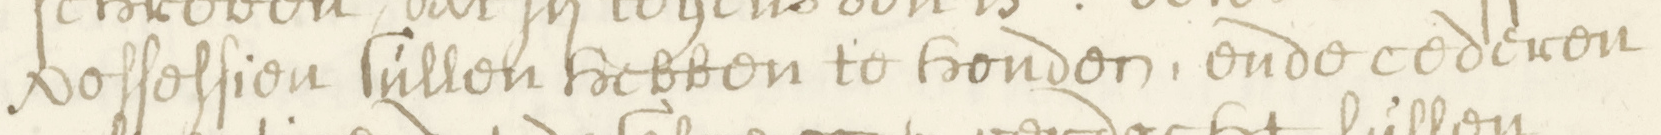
possessien sullen hebben te houden, ende cederen
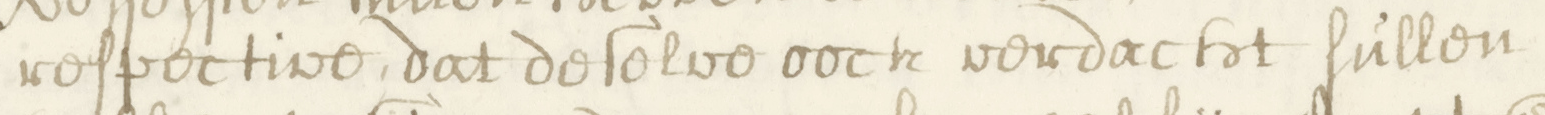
respective, dat deselve oock verdacht sullen
